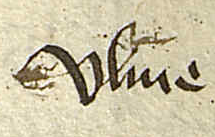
Vlme
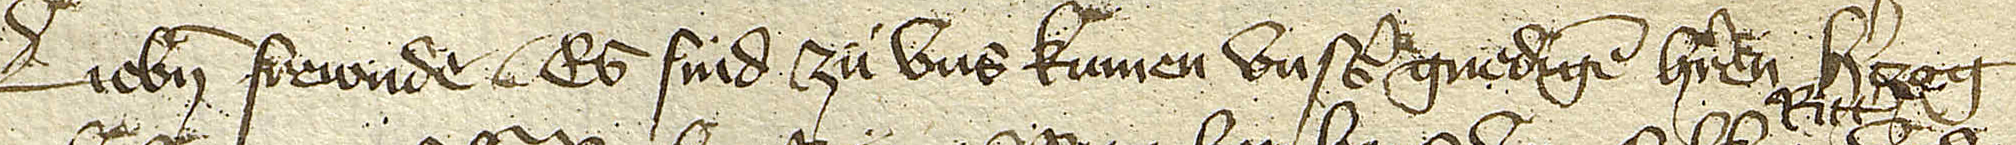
Liebn* frewnde / Es ſind cʒü vns kumen vnſs* gnedige* hr*en h*cʒog
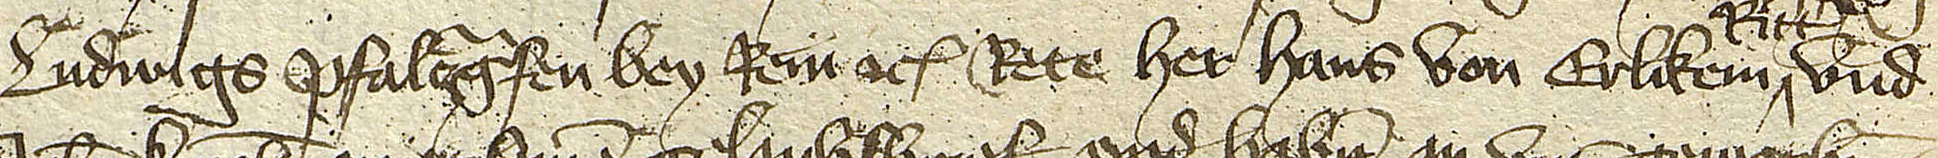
Ludwigs Pfalcʒgfen* bey Rein ec* Rete her hans von Erlikeim vnd
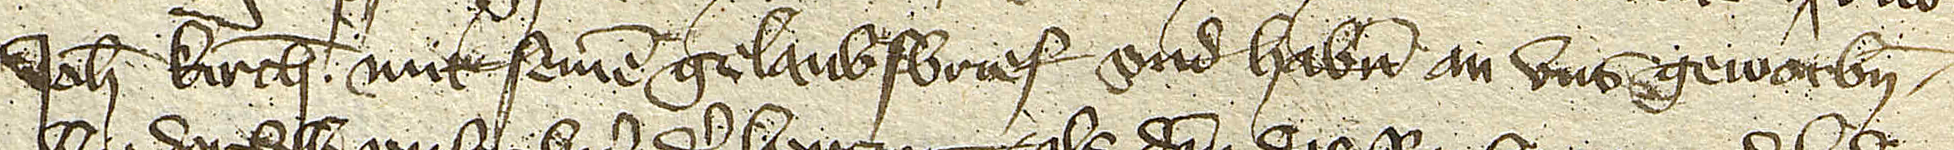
Ioh* kirch* . mit ſeine* gelaubſbrief vnd habn* an vns geworbn* /
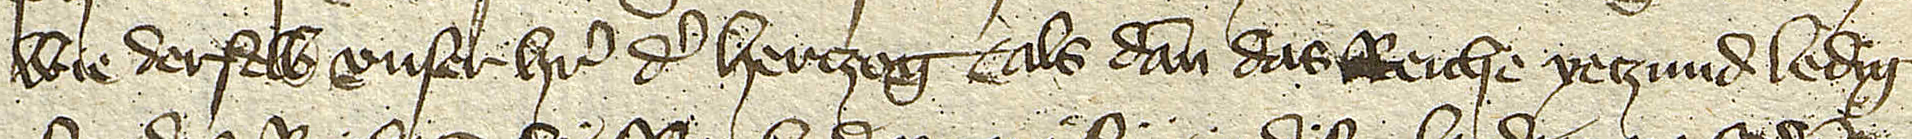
wie derſelb vnſer hr* d* hercʒog / als dan* das Reiche yecʒund ledig
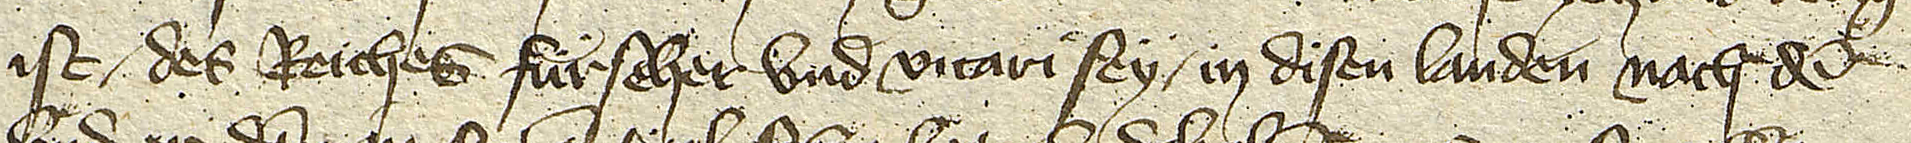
iſt / des Reiches fürſeher vnd vicari ſey / in diſen landen nach d*
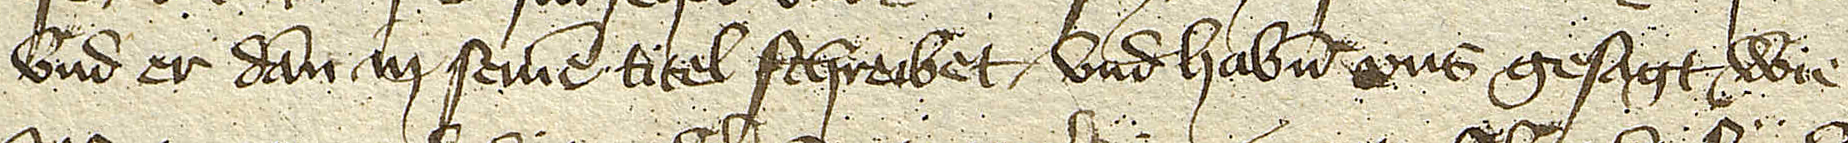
vnd er dan* in ſeine* titel ſchreibet / vnd habn* vns geſagt / wie
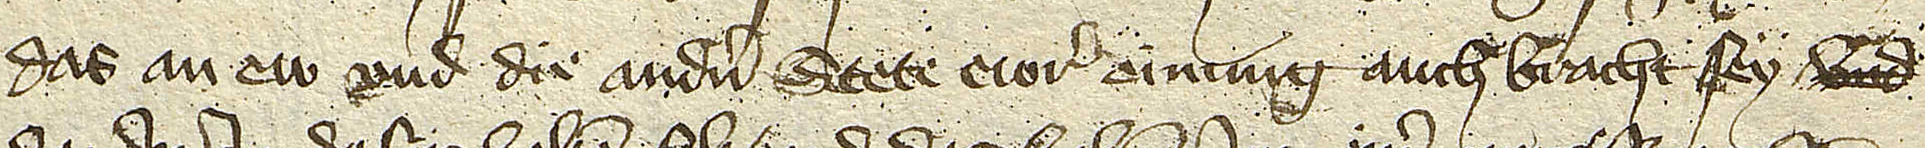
das an ew vnd die andn* Stete ewr* einung auch bracht ſey / vnd
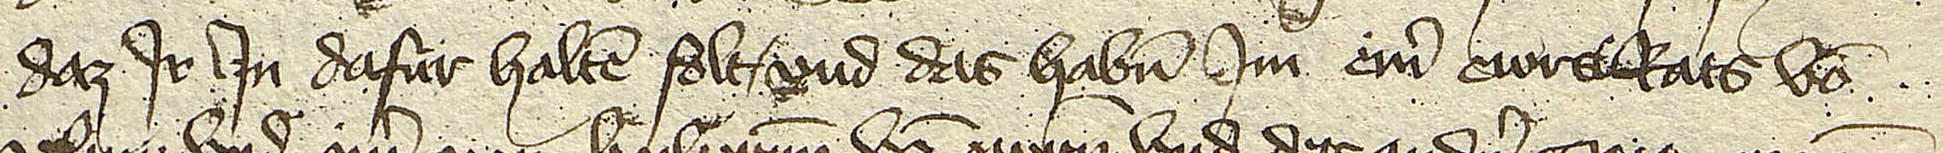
daʒ Ir In dafür halte* ſolt / vnd das habn* Im ein* ewrs* Rats vo*
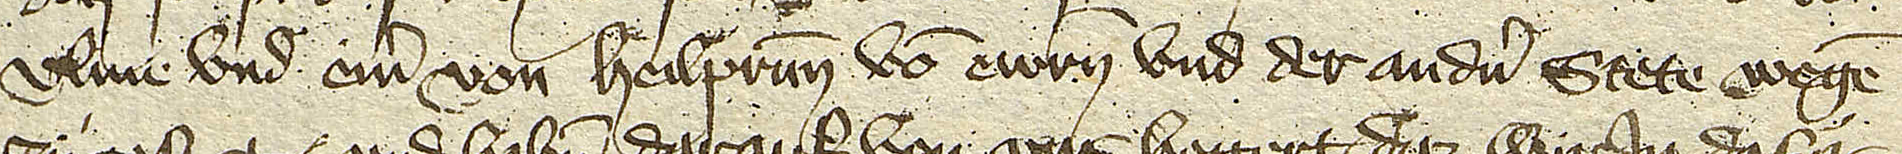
Vlme vnd ein* von heilprun* vo* ewrn* vnd der andn* Stete wege*
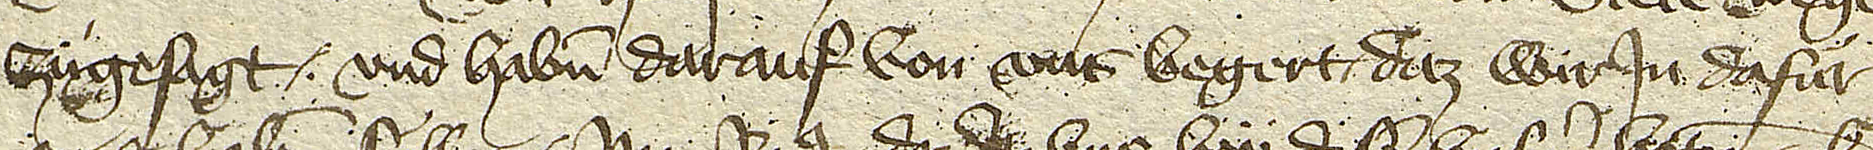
cʒügeſagt / . vnd habn* darauf von vns begert / daʒ wir In dafür
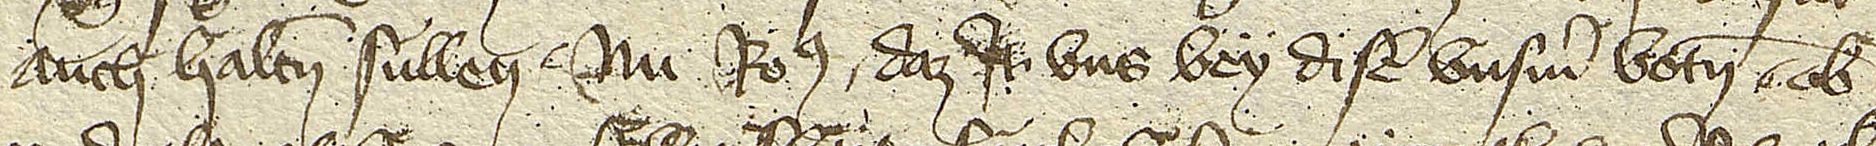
auch haltn* ſüllen / Nu Ro* / daʒ Ir vns bey diſe* vnſm* botn* / ob
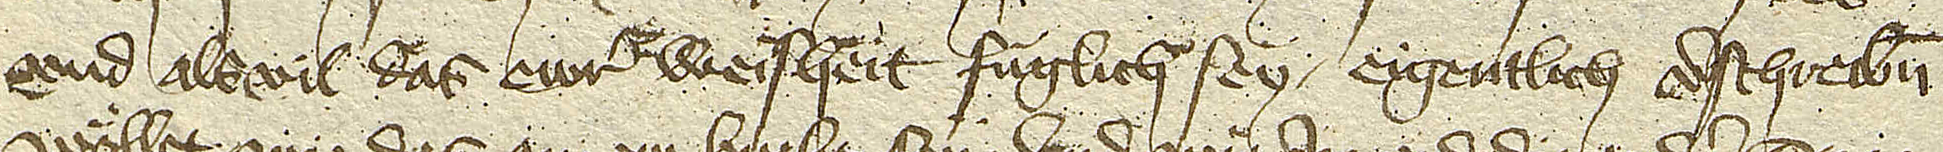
vnd als vil das ewr* weiſheit füglich ſey / eigentlich v*ſchreibn*
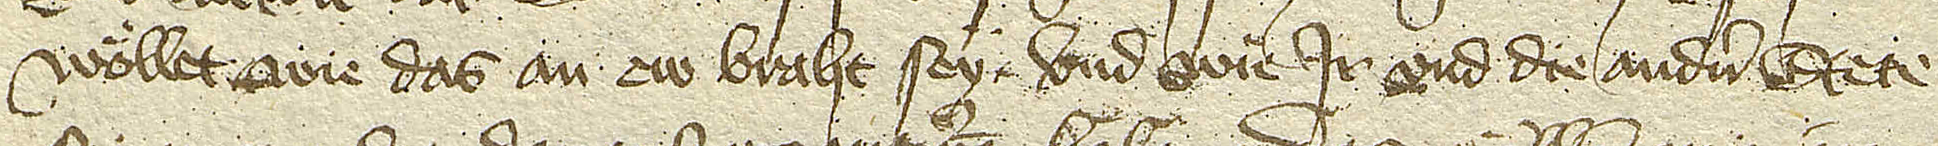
wöllet / wie das an ew braht ſey / vnd wie Ir vnd die andn* Stete
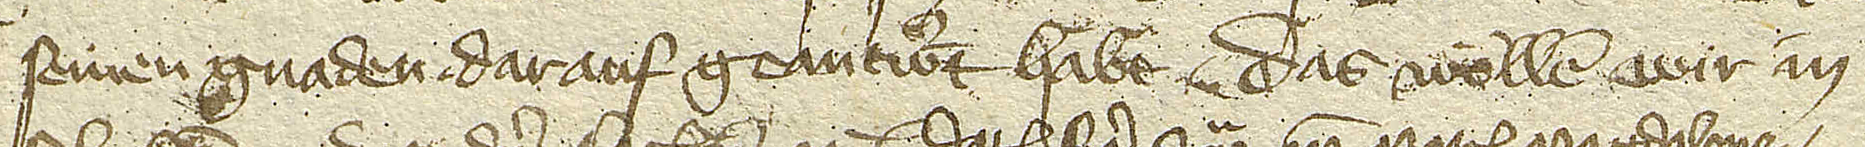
ſeinen gnaden / darauf geantw*t habt / Das wölle* wir in
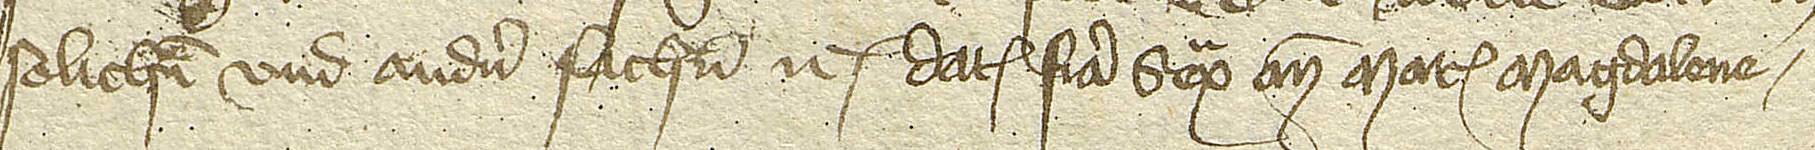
ſolichn* vnd andn* ſachn* ec* dat* fia* Sex* an* Mar* Magdalene /
